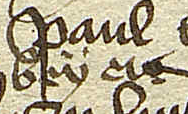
bey ew
